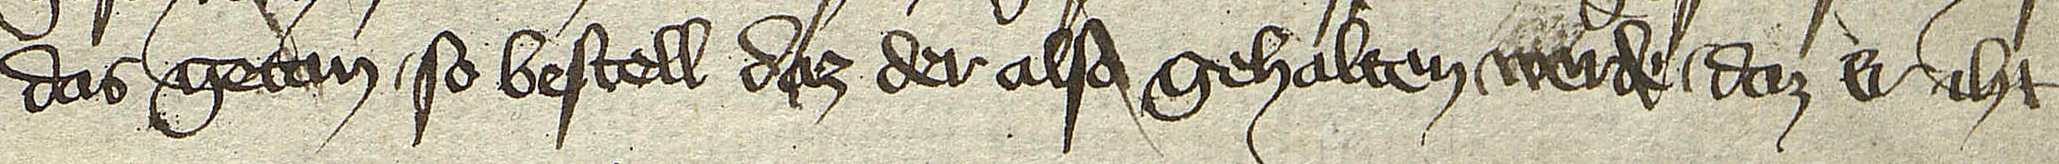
das getan / ſo beſtell daʒ der alſo gehalten werde / daʒ Er iht
